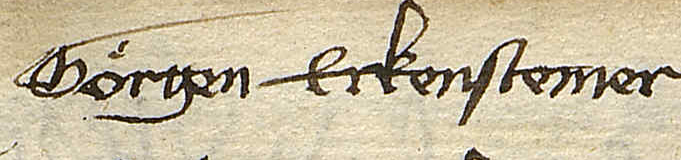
Görgen Erkenſteiner
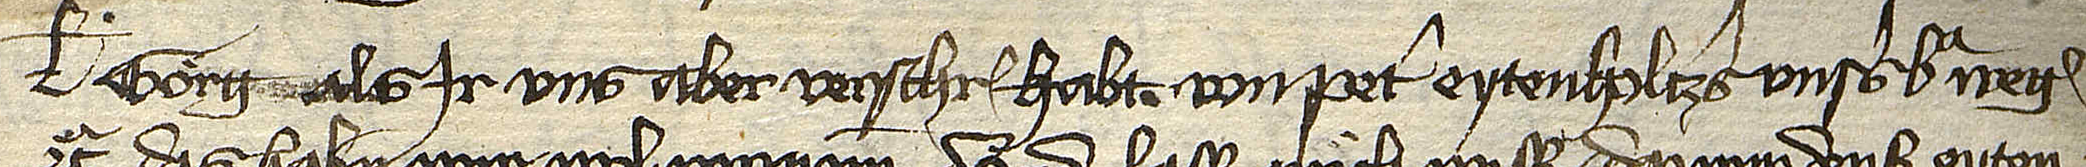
L* Görg als Ir vns aber verſchr* habt von Pet* eytenholcʒ*s vnſ*s b* weg*
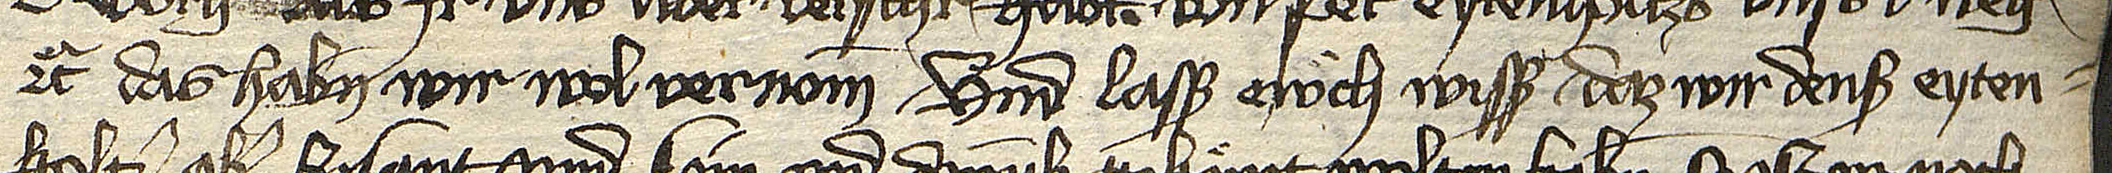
ec* das habn* wir wol vernom* / Vnd laſſ* ewch wiſſ* / daʒ wir denſ* eyten =
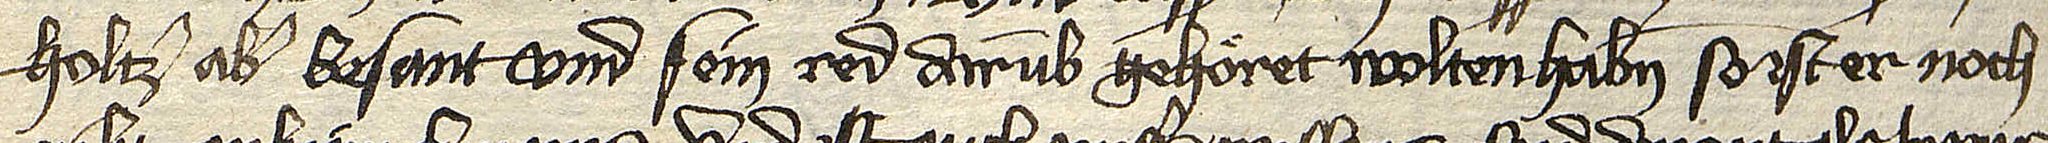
holcʒ* ab* beſant vnd ſein red darub* gehöret wolten habn* ſo iſt er noch
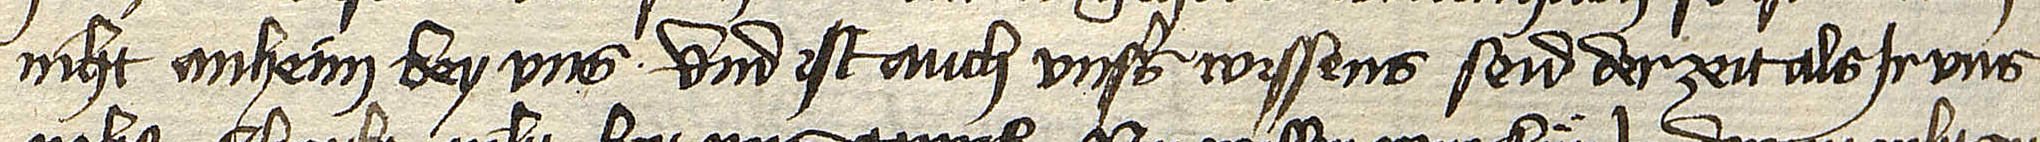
niht anheim bey vns . Vnd iſt auch vnſ*s wiſſens ſeid derʒeit als Ir vns
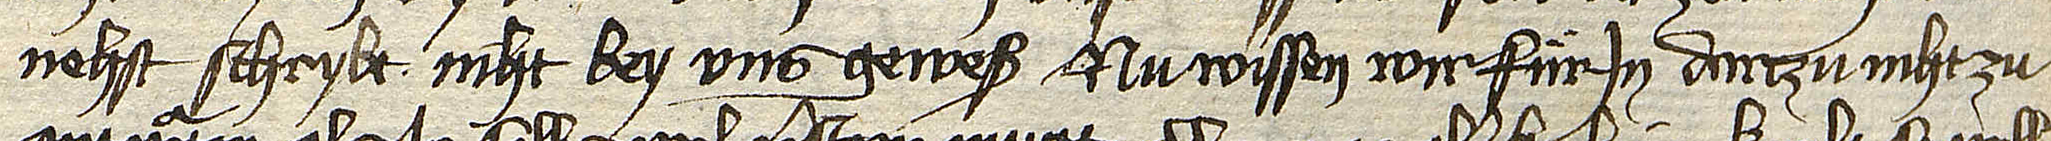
nehſt ſchrybt . niht bey vns geweſ* / Nu wiſſen wir für In darcʒu niht ʒu
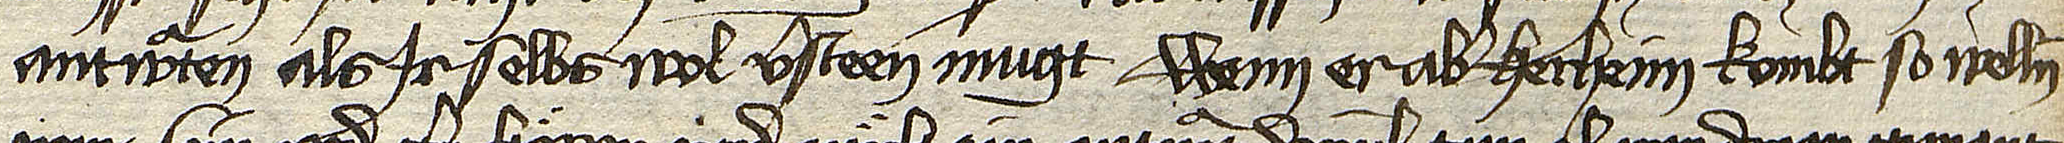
antw*ten als Ir ſelbs wol v*ſteen mugt / Wenn er ab* herheim kombt ſo welln*
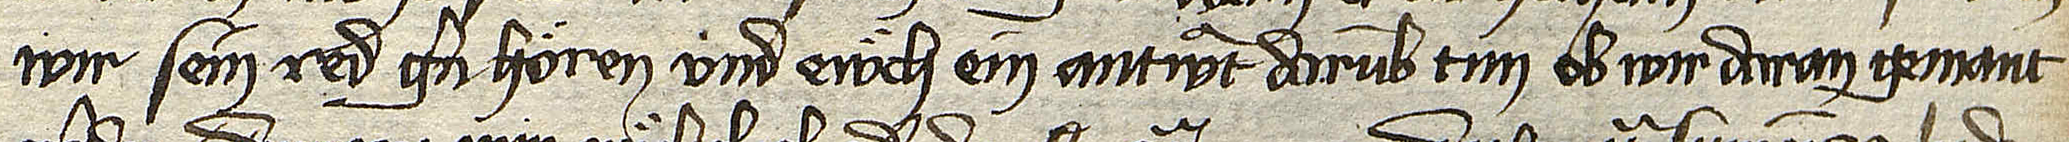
wir ſein red g*n hören vnd ewch ein antw*t darub* tun ob wir daran gemant
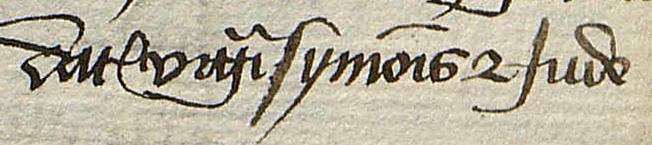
Dat* vigi* ſymois* @ Iude
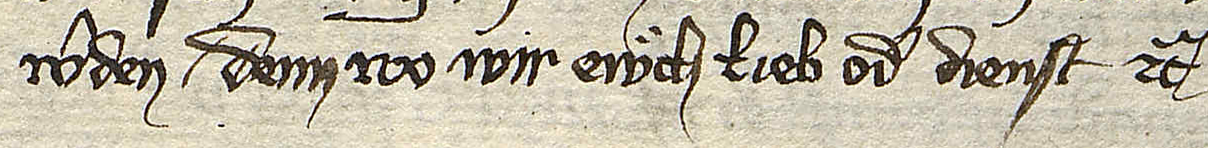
w*den / Denn wo wir eẅch lieb od* dienſt ec*
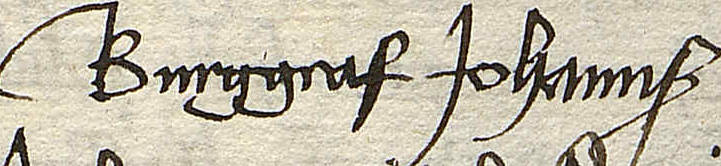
Burggraf Iohannſ*
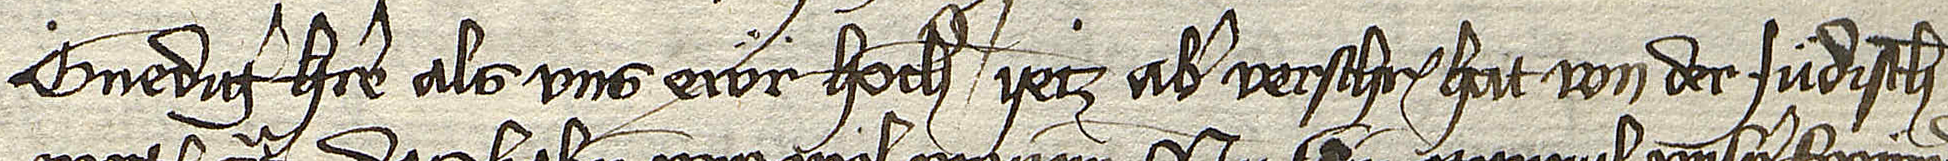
Gnedig* hr*e als vns ewr hoch* yecʒ ab* verſchr* hat von der Iüdiſch*
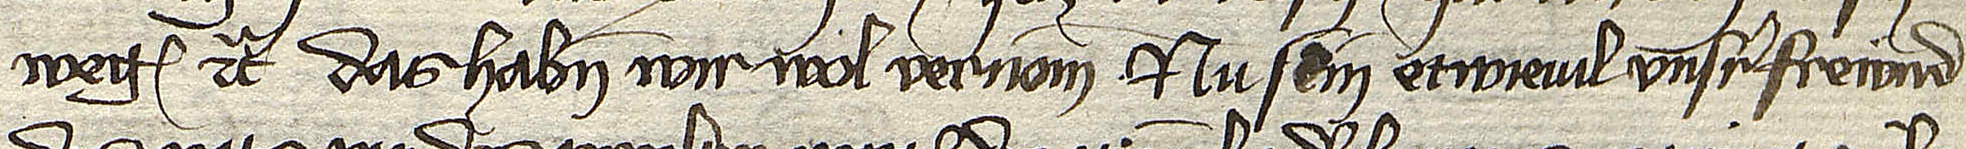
weg* ec* das habn* wir wol vernom* Nu ſein etwieuil vnſr* frewnd
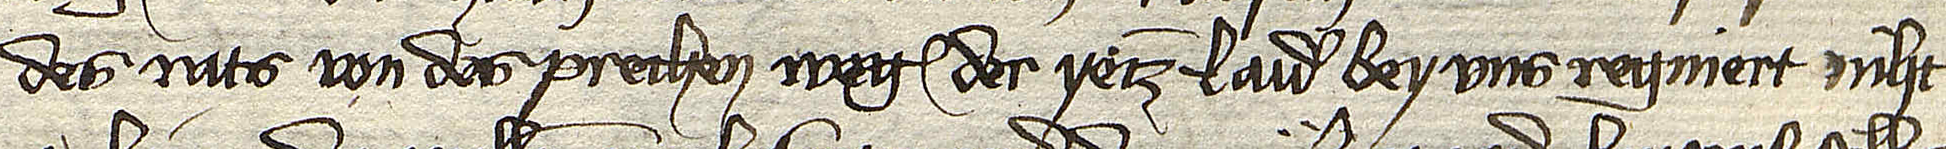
des rats von des prechen weg* der yecʒ* laid* bey vns regniert niht
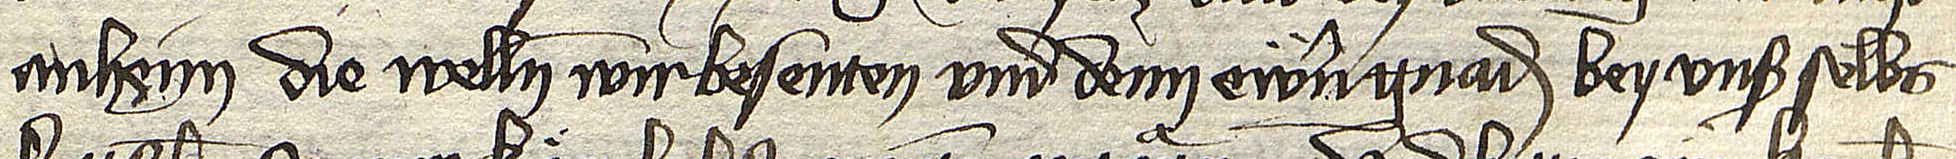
anheim die welln* wir beſenten vnd denn ew*n gnad* bey vnſ* ſelbs
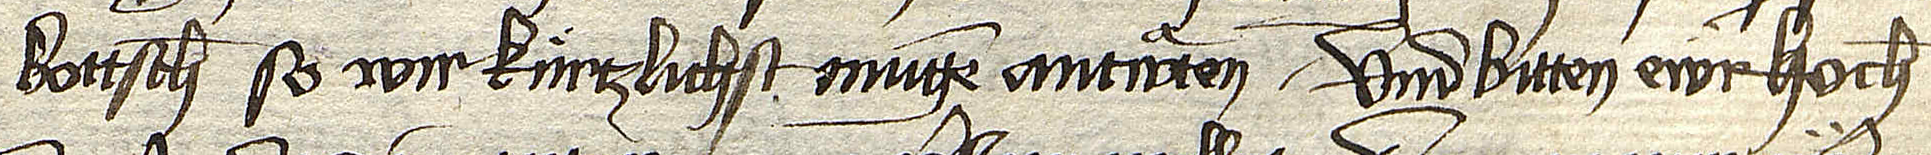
bottſch* ſo wir kürcʒlichſt muge* antw*ten / Vnd bitten ewr Hoch*
